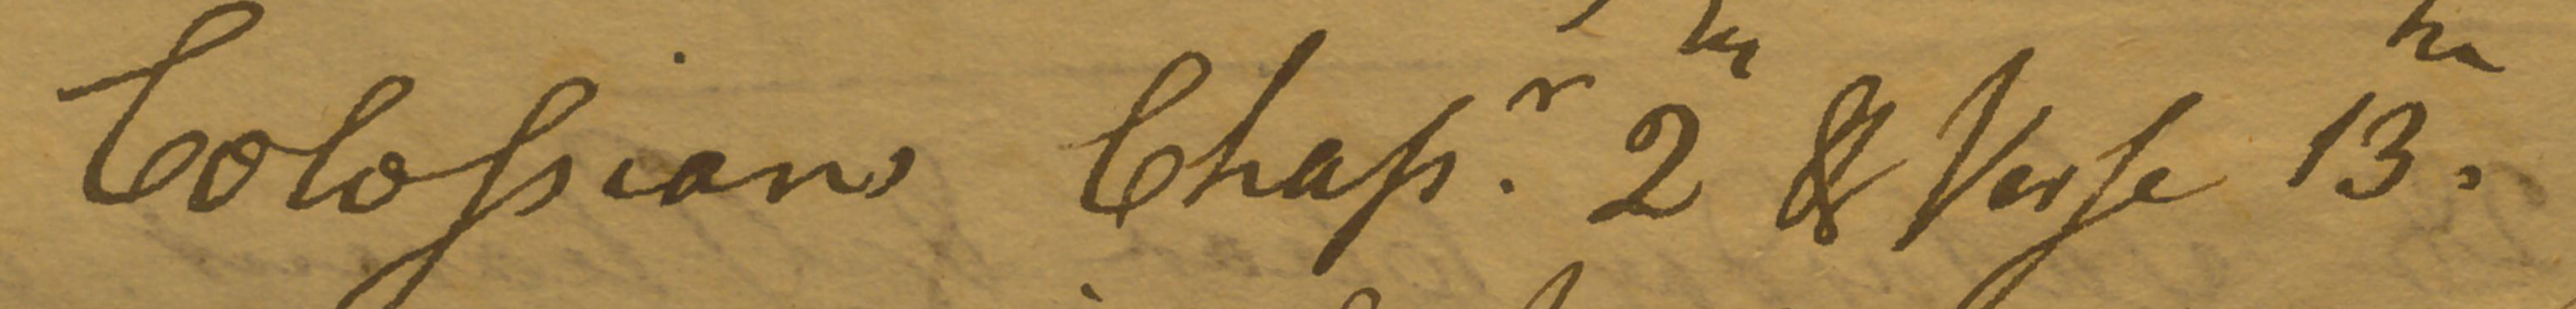Colossians Chap^r. 2^th & Verse 13^th.
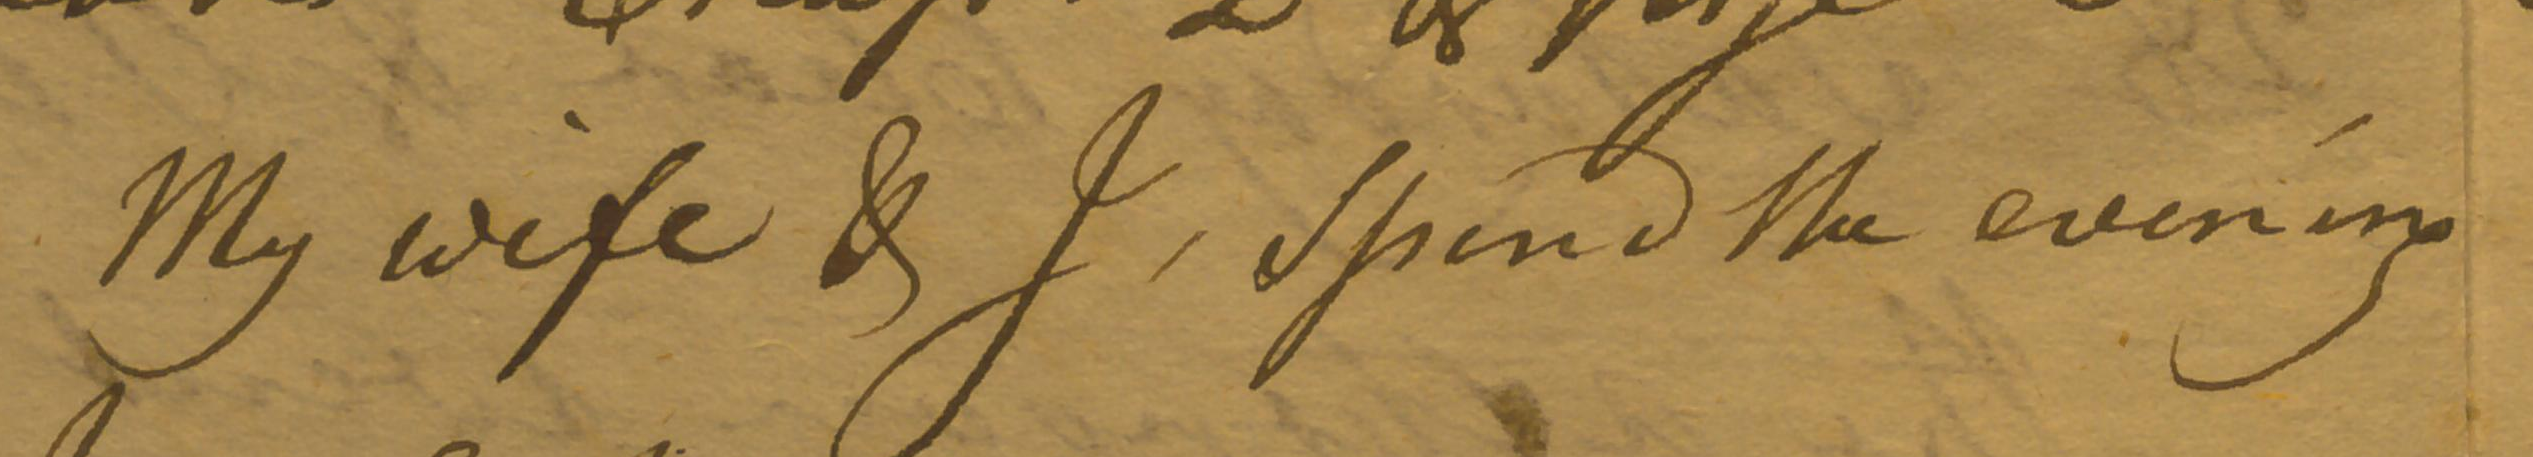My wife & I Spend the evening
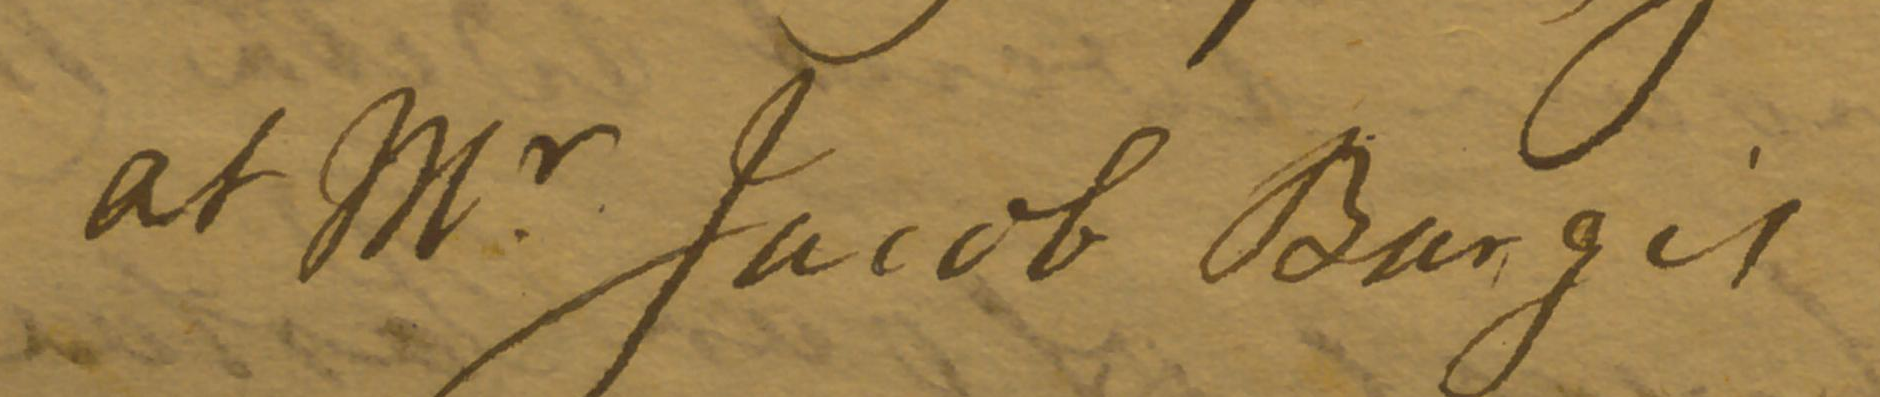at M^r. Jacob Barges
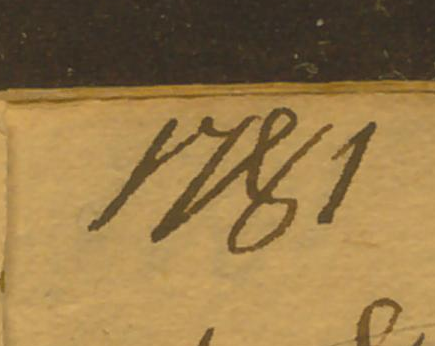1781
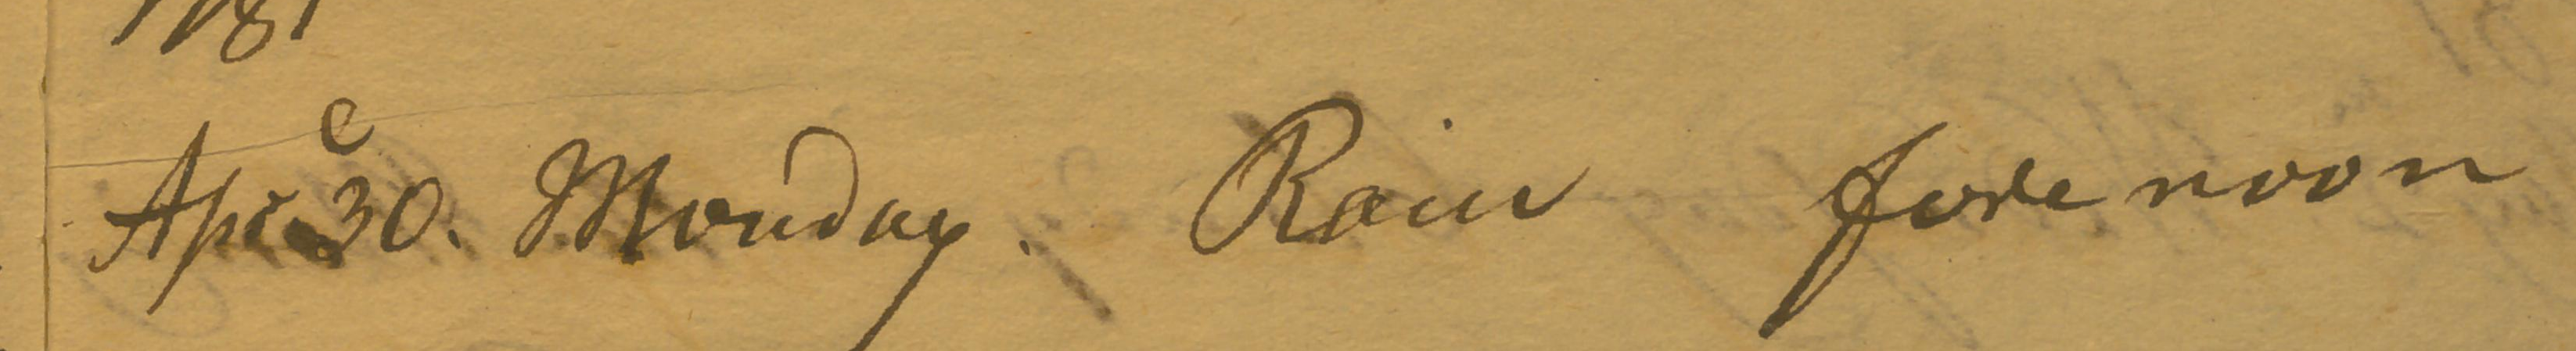Apr^l 30. Monday. Rain forenoon
